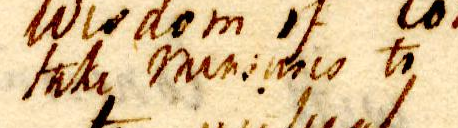take measures to
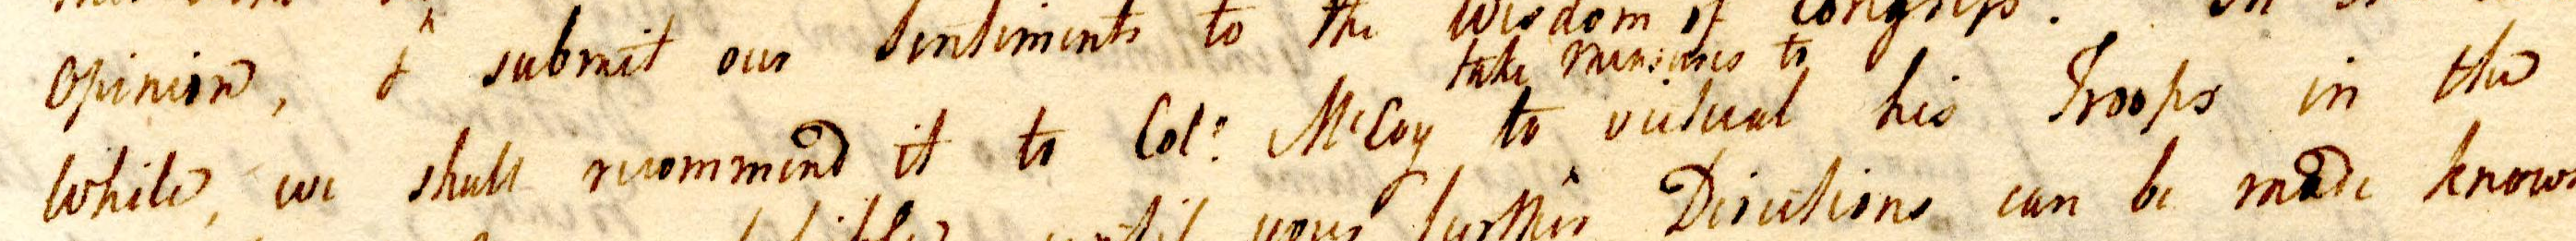while we shall recommend it to Col^o. McCoy to ^ victual his Troops in the
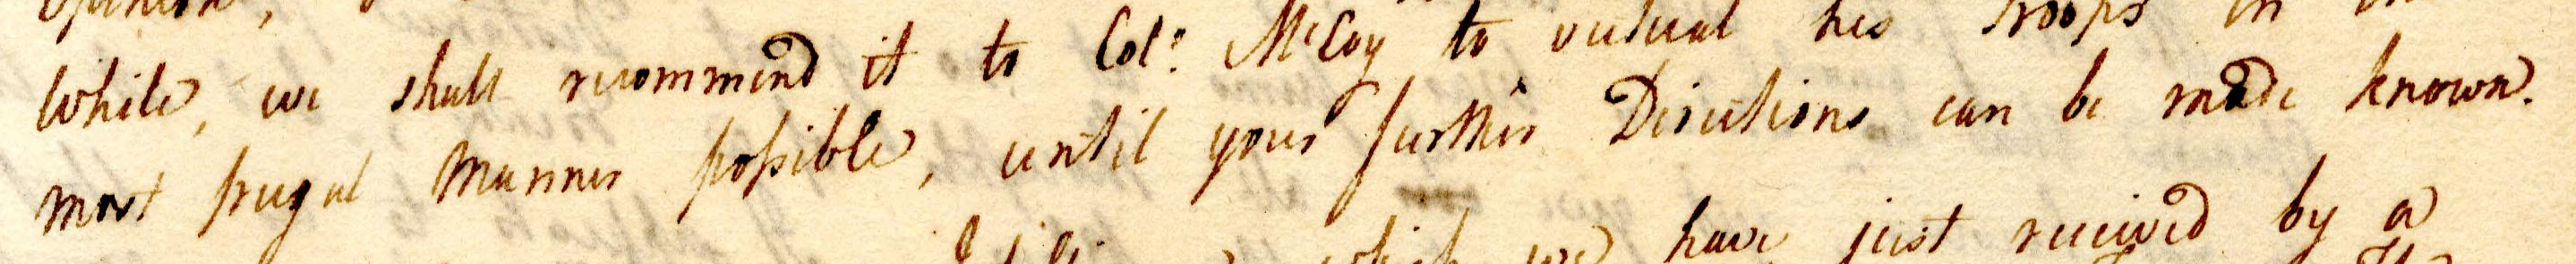most frugal Manner possible, until your further Directions can be made known.
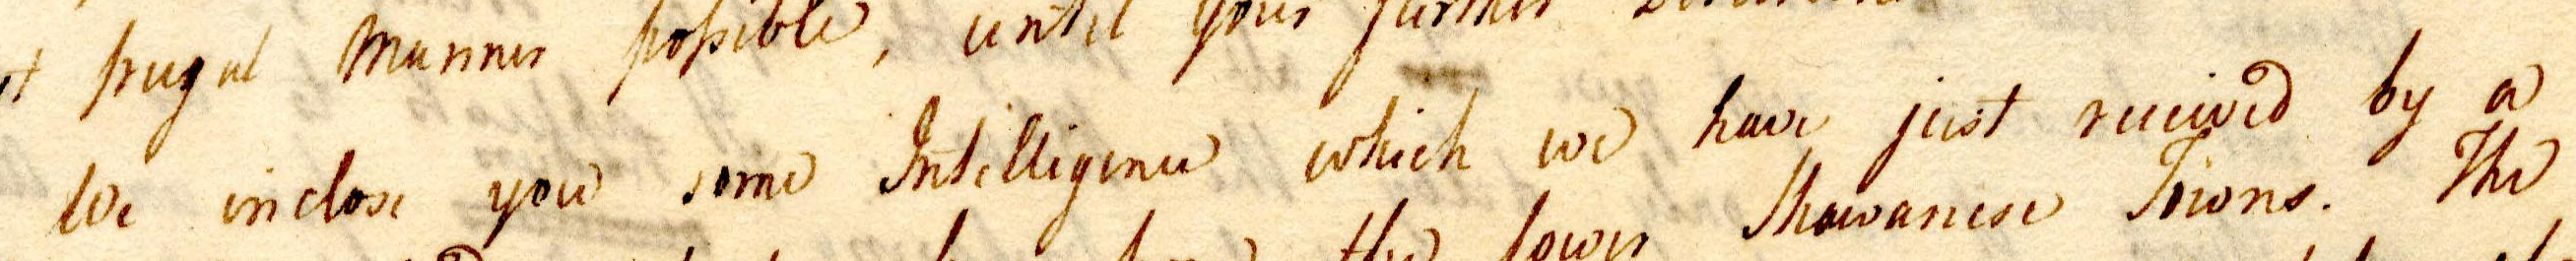We inclose you some Intelligence which we have just received by a
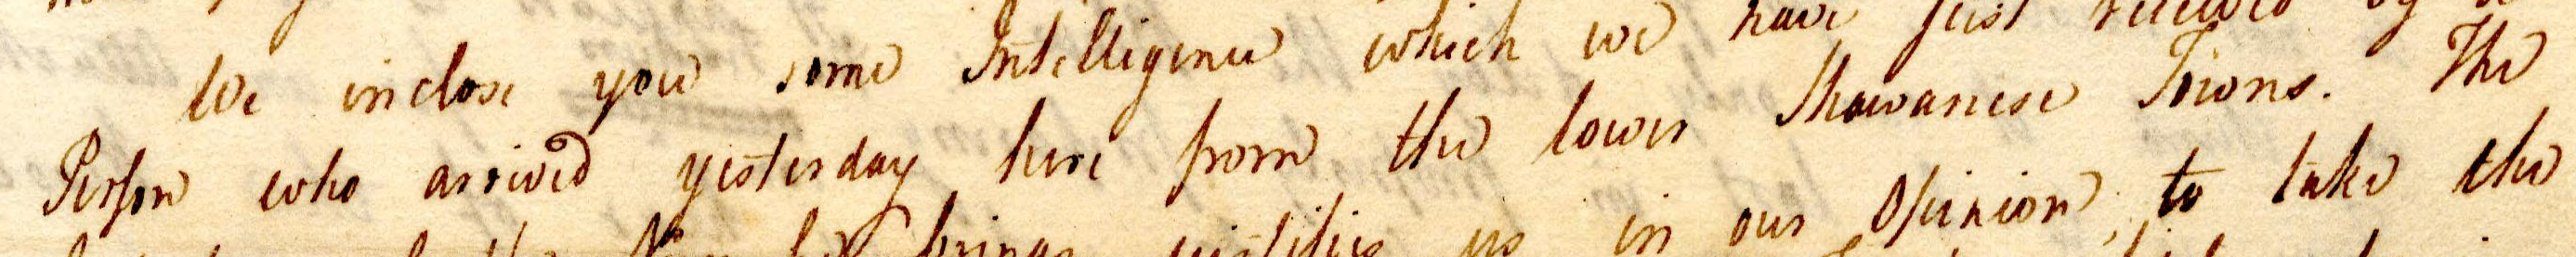Person who arrived yesterday here from the lower Shawanese Towns. The
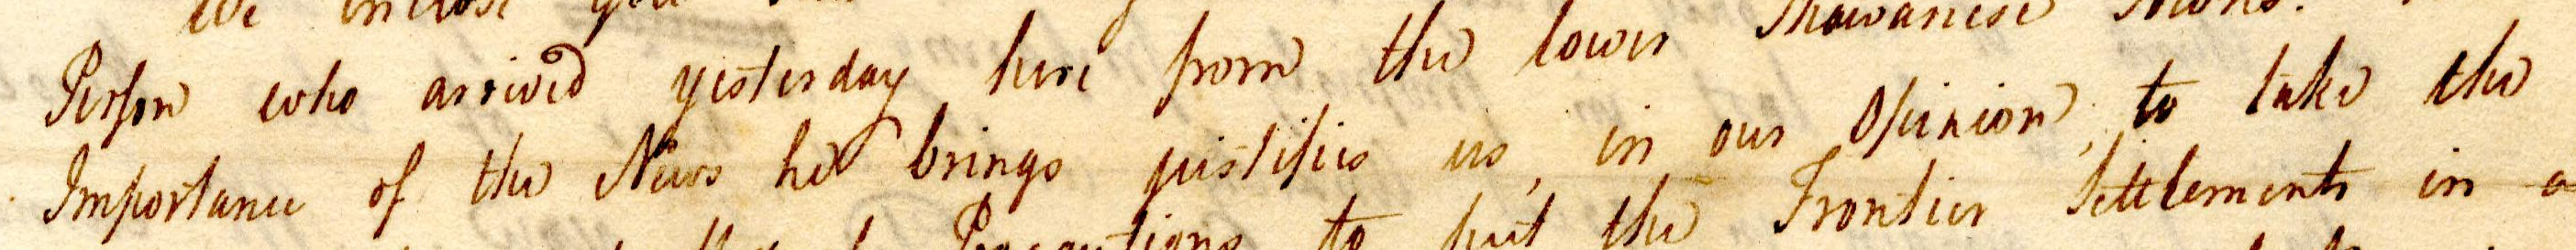Importance of the News he brings justifies us in our Opinion to take the
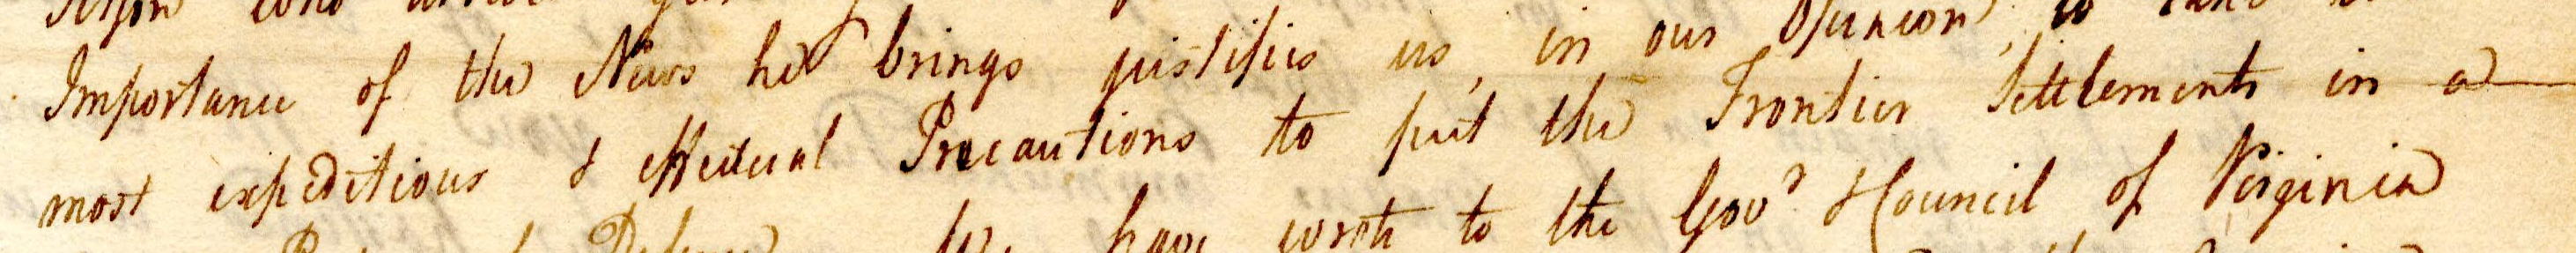most expeditious & effectual Precautions to put the Frontier Settlements in a
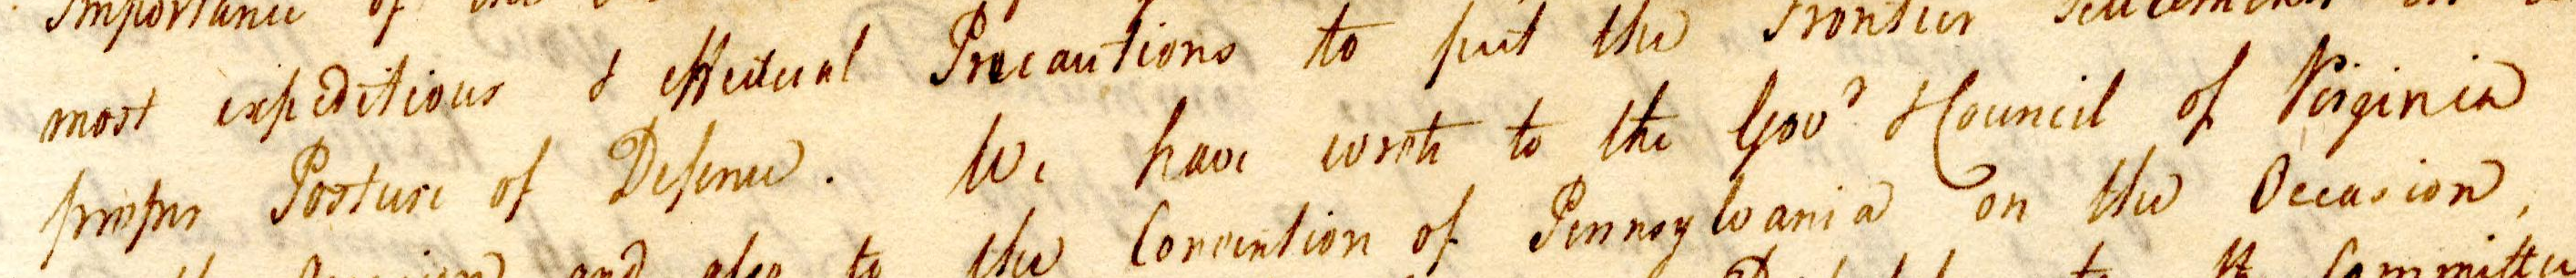proper Posture of Defense. We have wrote to the Gov^r & Council of Virginia
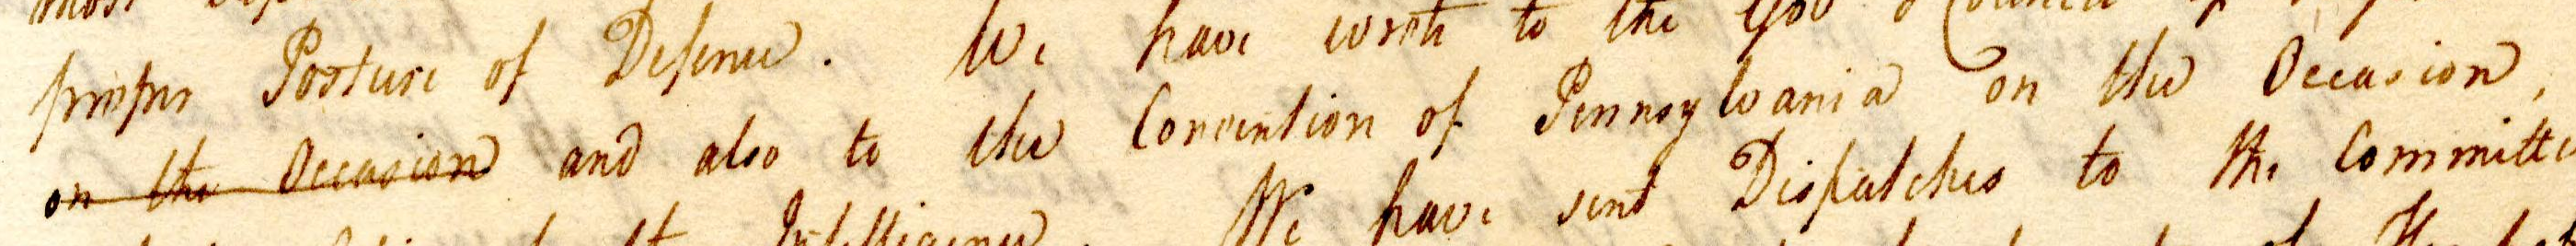on the Occasion and also to the Convention of Pennsylvania on the Occasion
